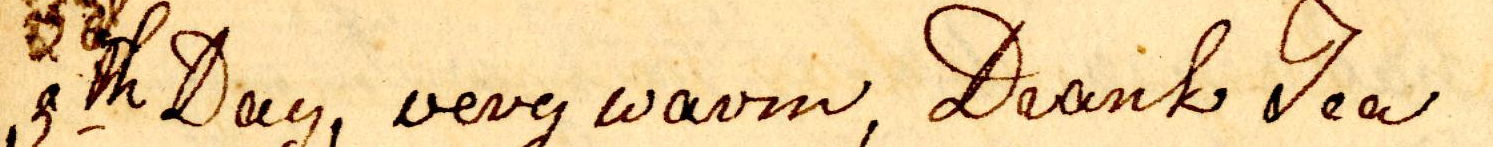5^th Day, very warm, Drank Tea
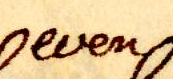even
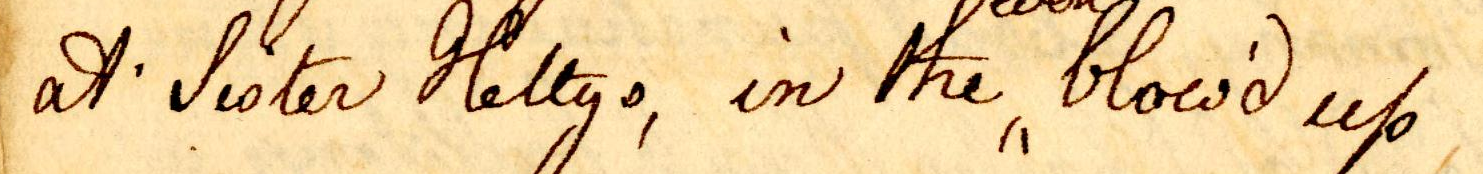at Sister Hettys, in the ^ blow'd up
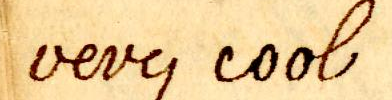very cool
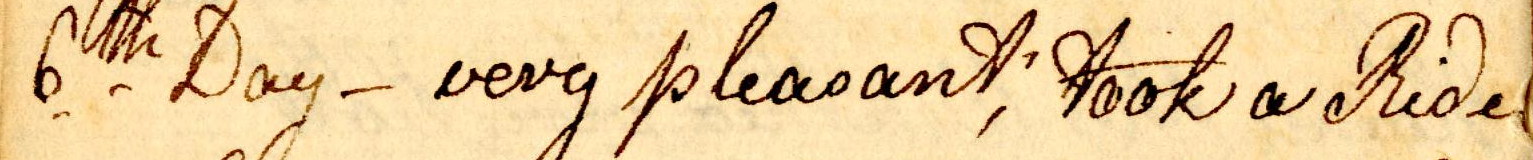6^th Day- very pleasant, took a Ride
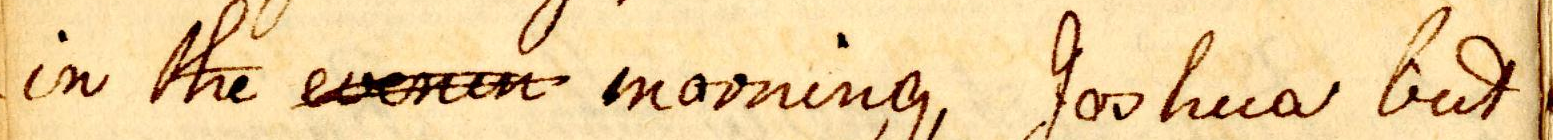in the [evenin] morning, Joshua but
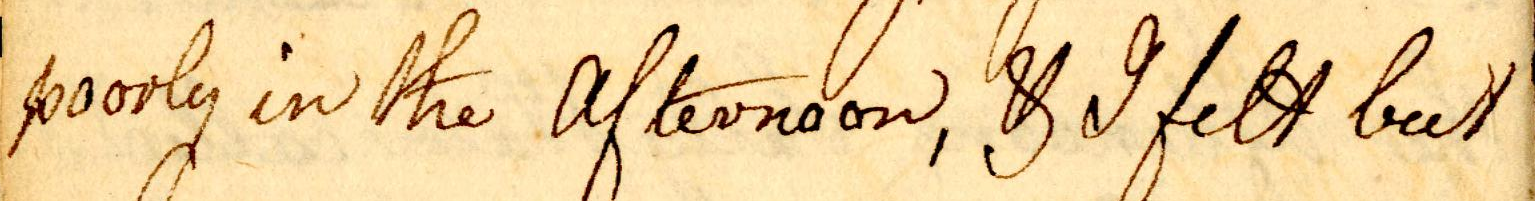poorly in the Afternoon, & I left but
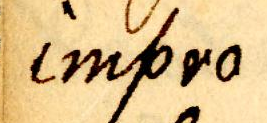impro
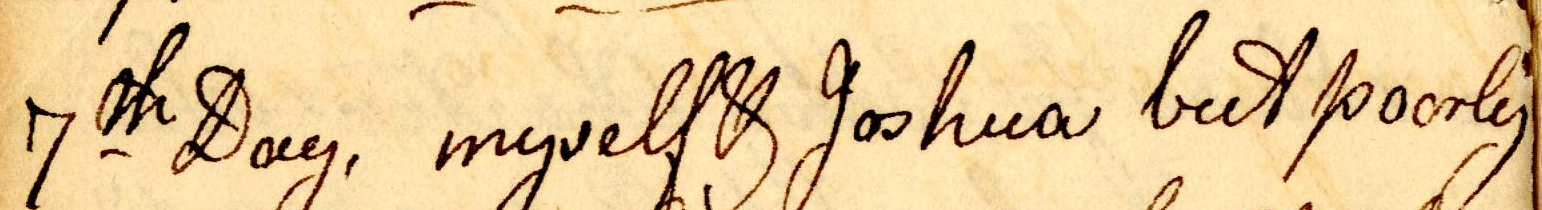7^th Day, myself & Joshua but poorly
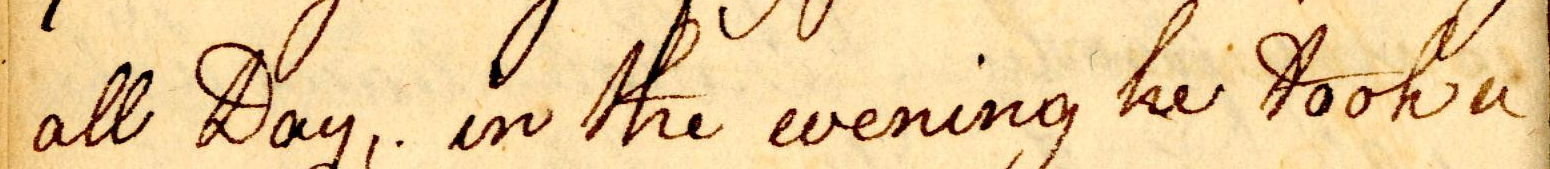all Day, in the evening he took a
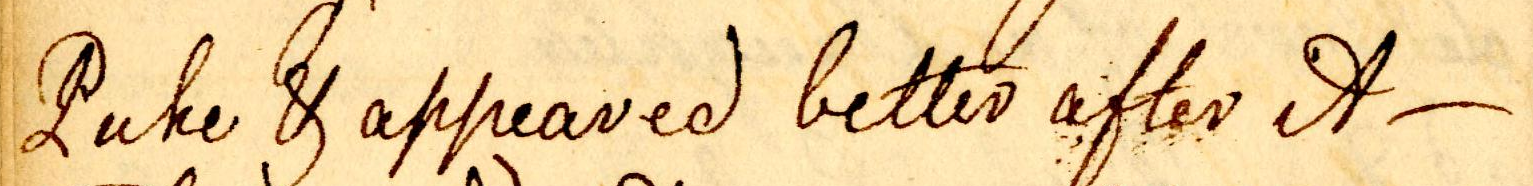Puke & appeared better after it-
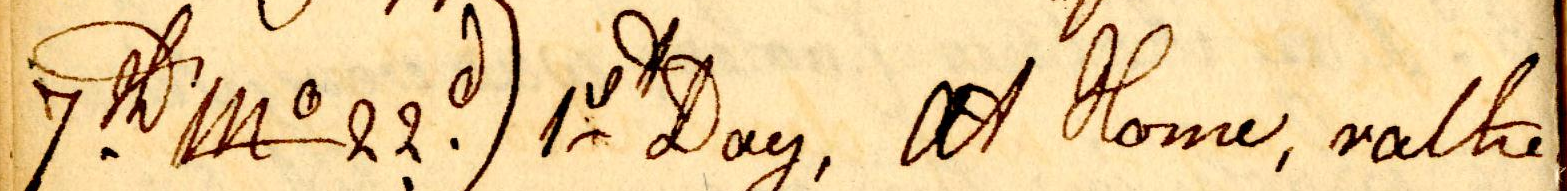7^th M^o 22^d.) 1^st Day, At Home, rathe
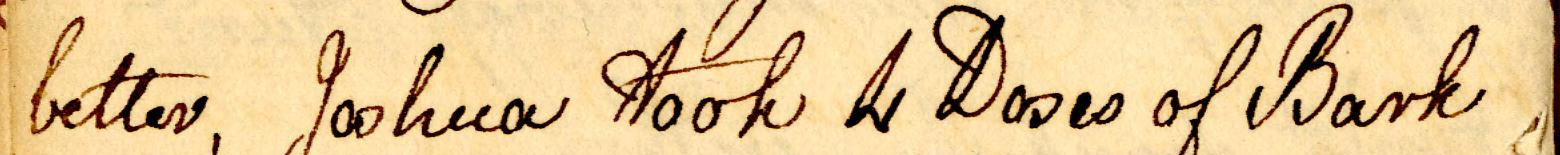better, Joshua took 4 Doses of Bark
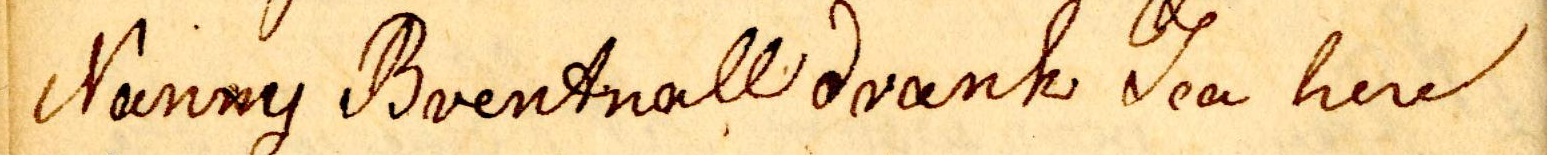Nanny Brentnall drank Tea here
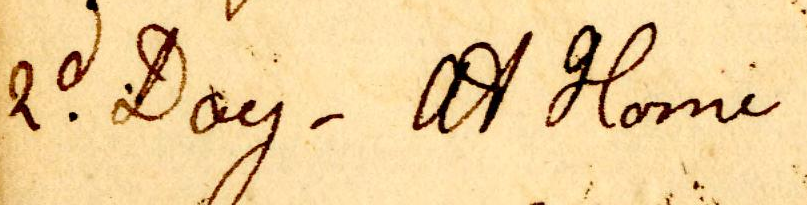2^d. Day- At Home
